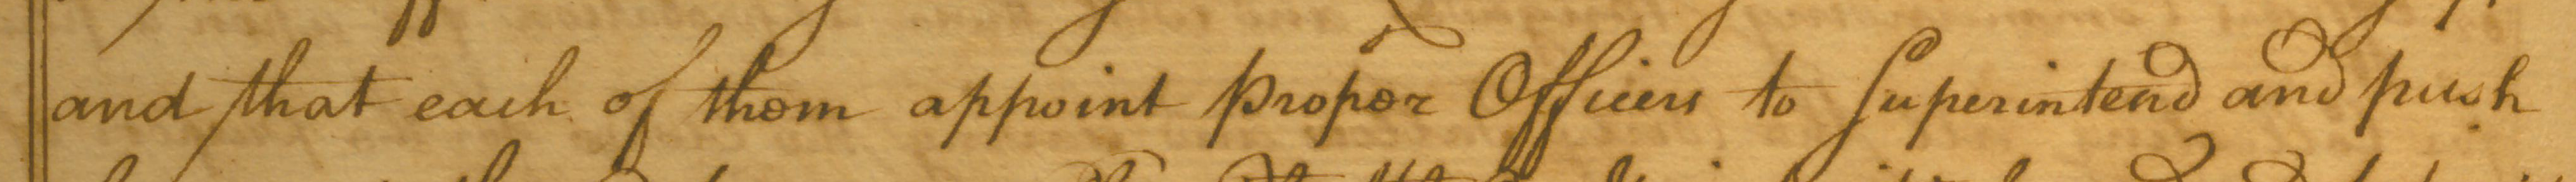and that each of them appoint proper Officers to superintend and push
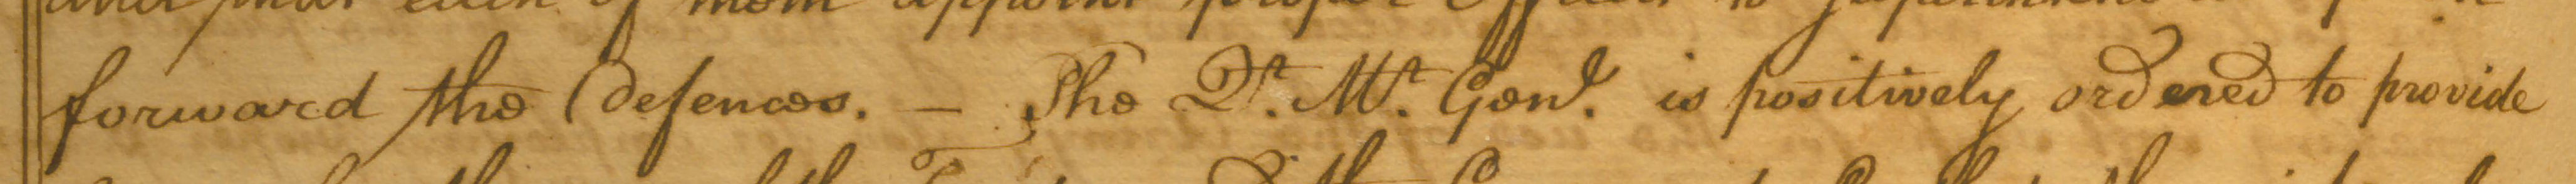forward the defences. The Q^r. M^r. Gen^l.- is positively ordered to provide
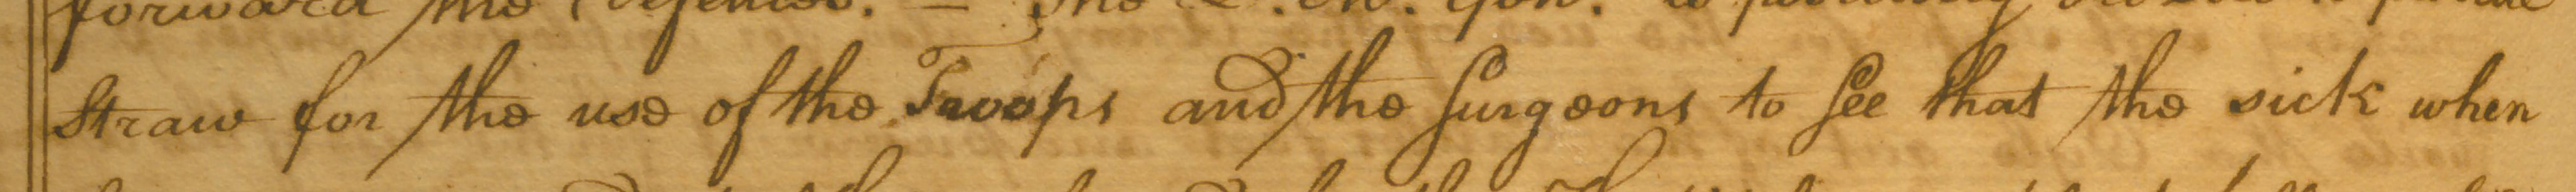straw for the use of the Troops and the surgeons to see that the sick when
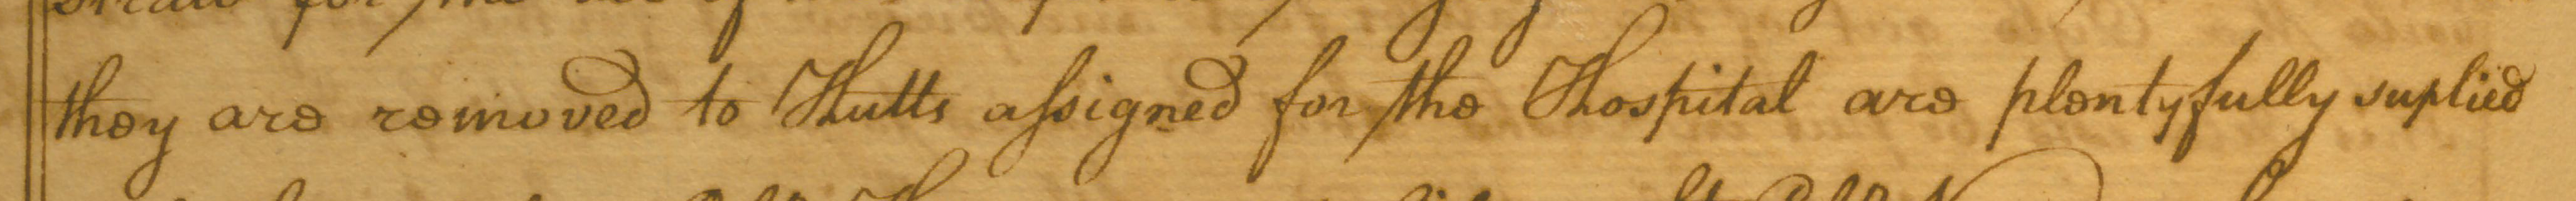they are removed to Hutts assigned for the Hospital are plentyfully suplied
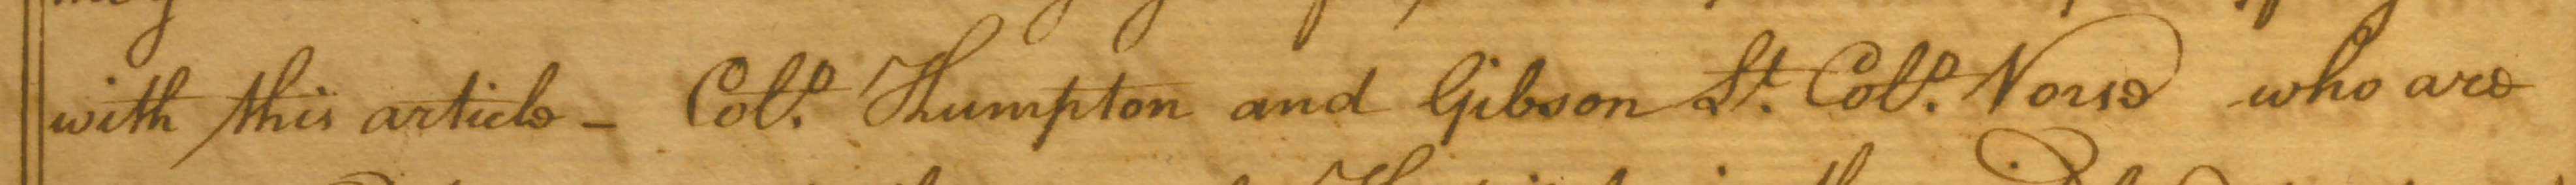with this article- Col^o. Humpton and Gibson L^t. Col^o. Vorse who are
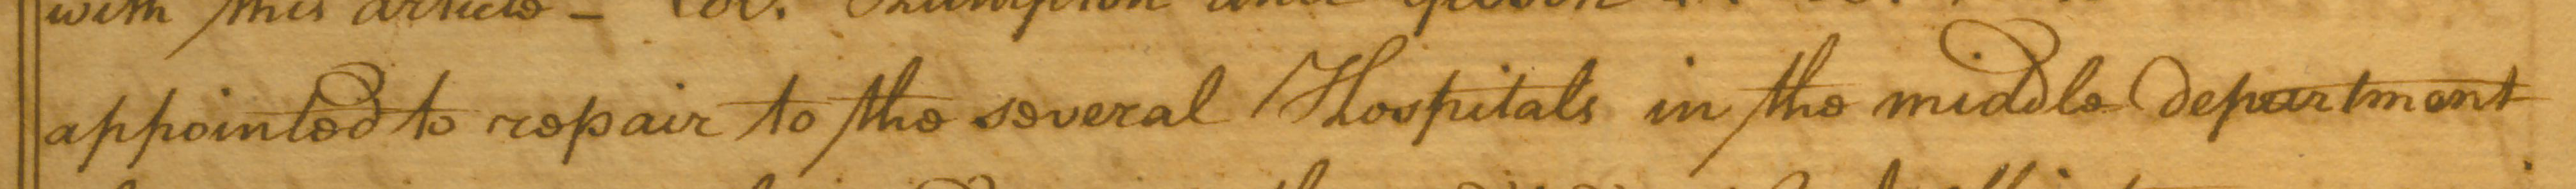appointed to repair to the several Hospitals in the middle department
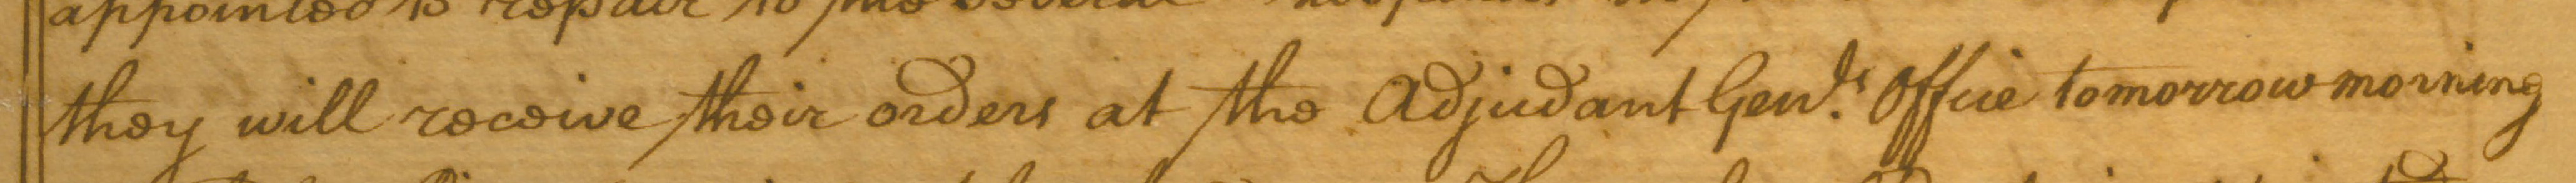they will receive their orders at the Adjudant Gen^ls. Office tomorrow morning
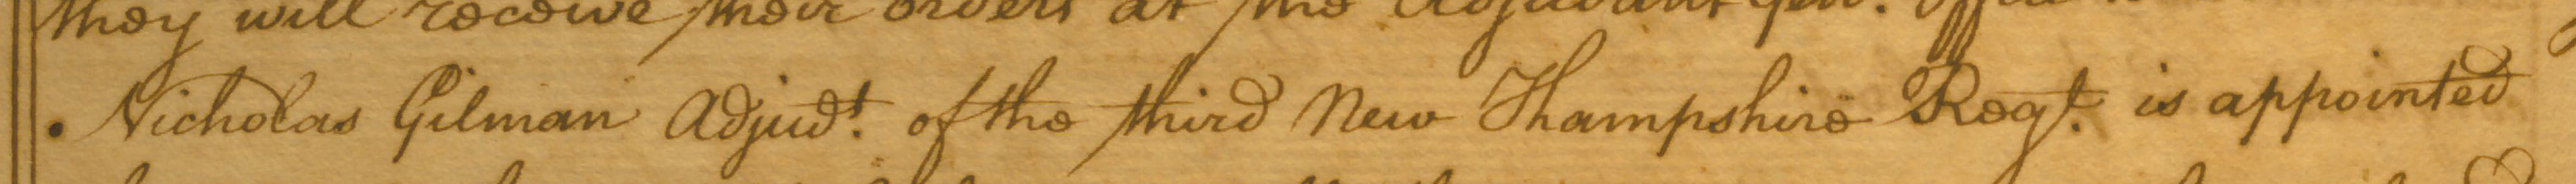Nicholas Gilman Adjud^t. of the third new Hampshire Reg^t. is appointed
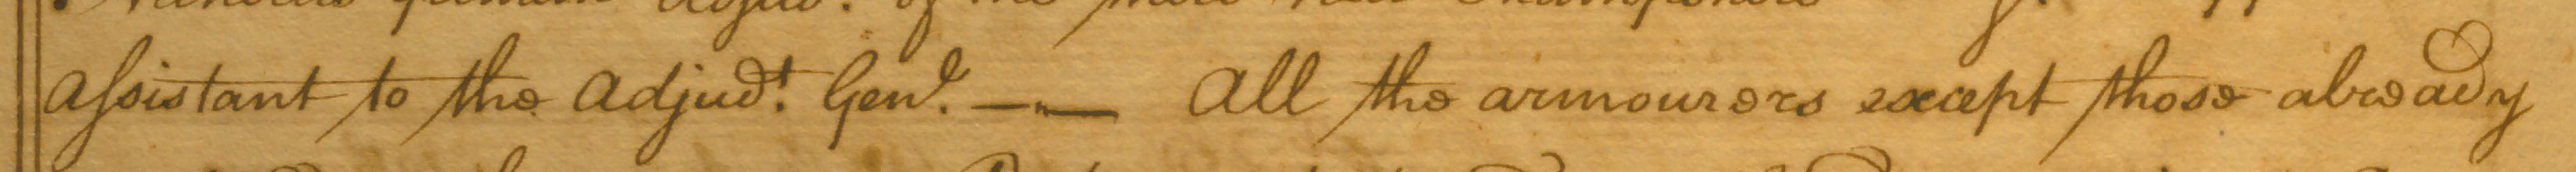assistant to the Adjud^t. Gen^l.- All the armourers except those already
